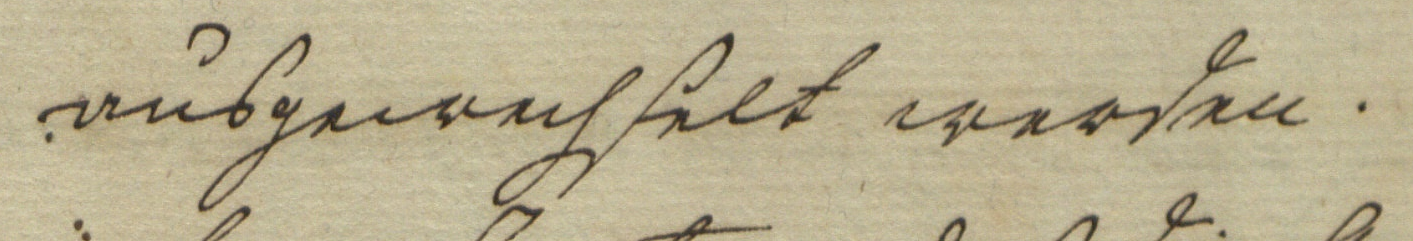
ausgewechselt werden.
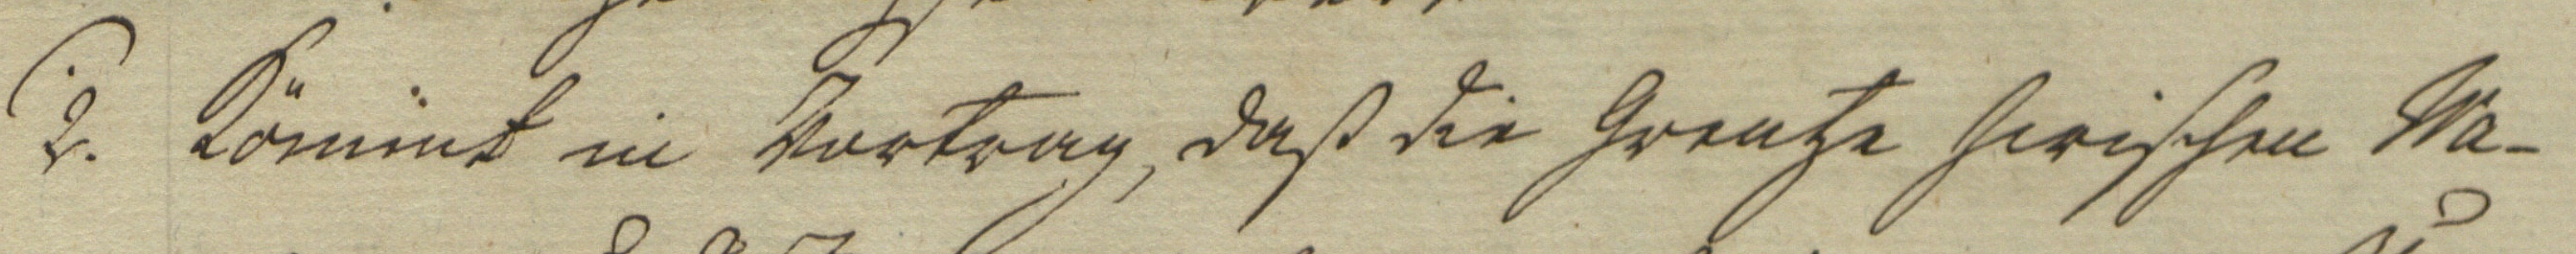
2. Kömmt in Vortrag, daß die Grentze zwischen Wa¬
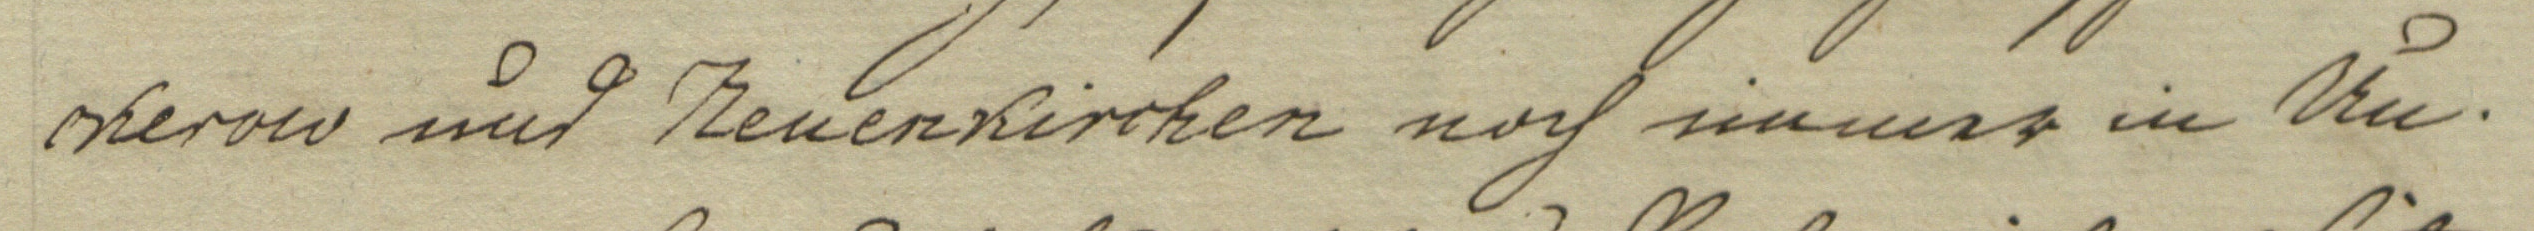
ckerow und Neuenkirchen noch immer in Un¬
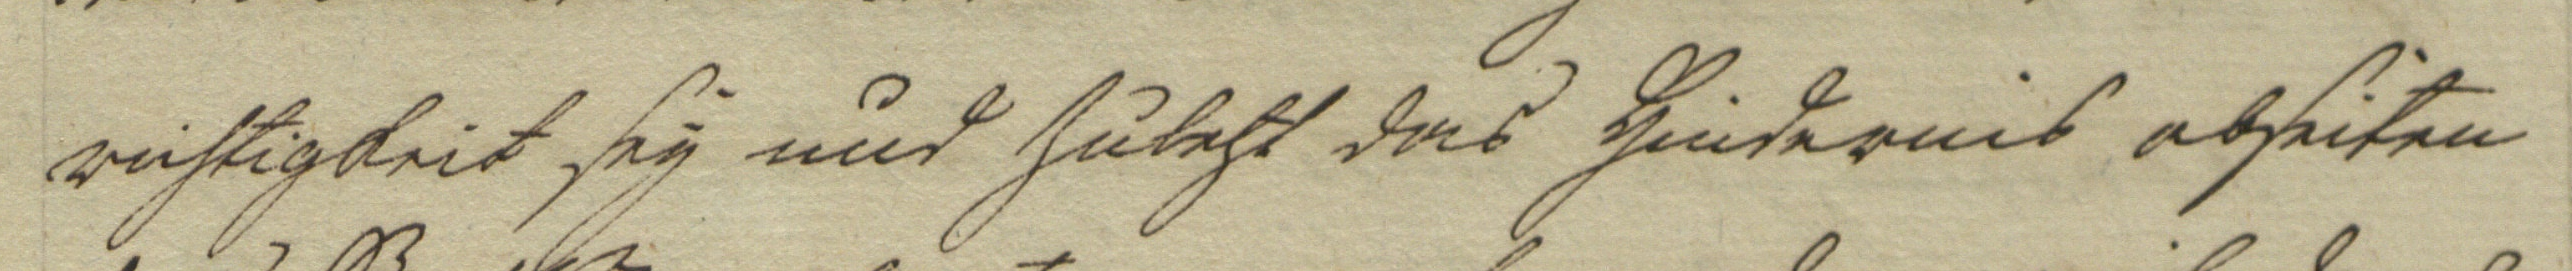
richtigkeit seÿ und zuletzt das Hindernis abseiten
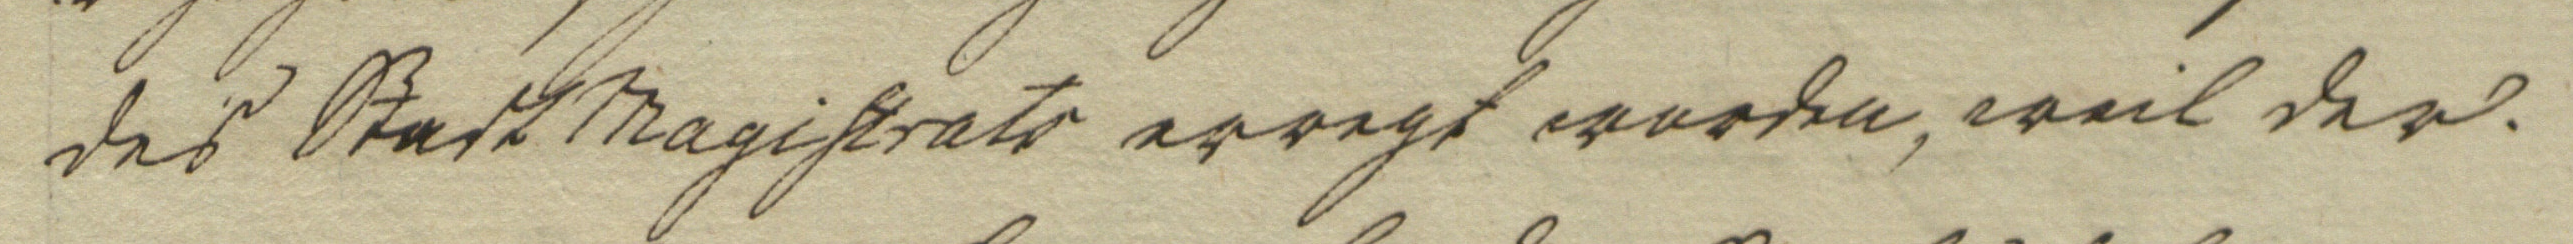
des Stadt Magistrats erregt worden, weil der¬
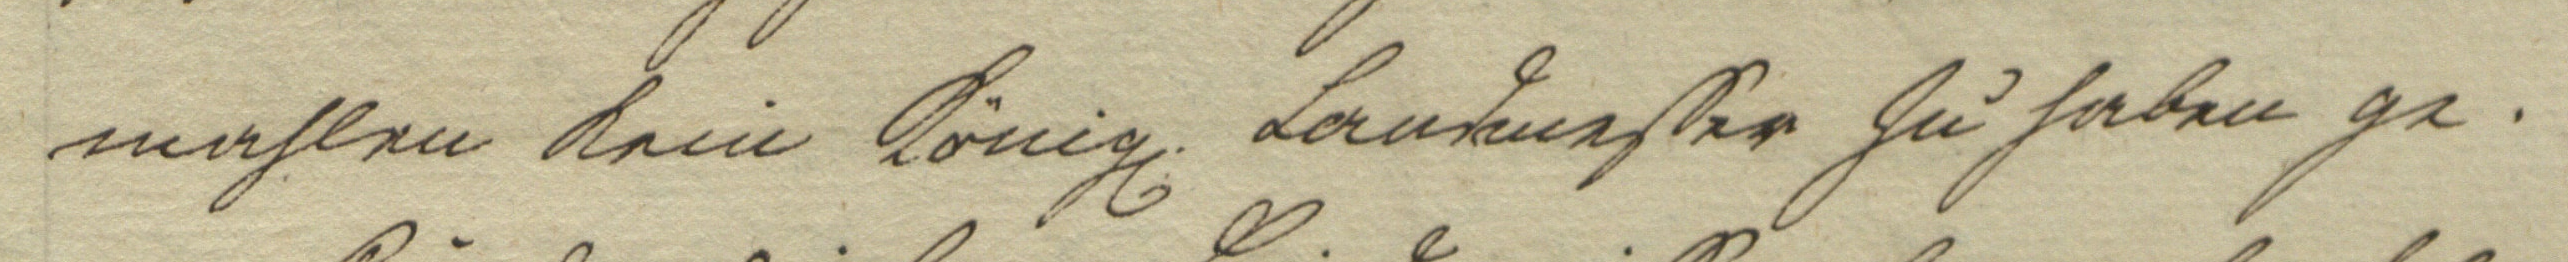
mahlen kein Königl. Landmesser zu haben ge¬
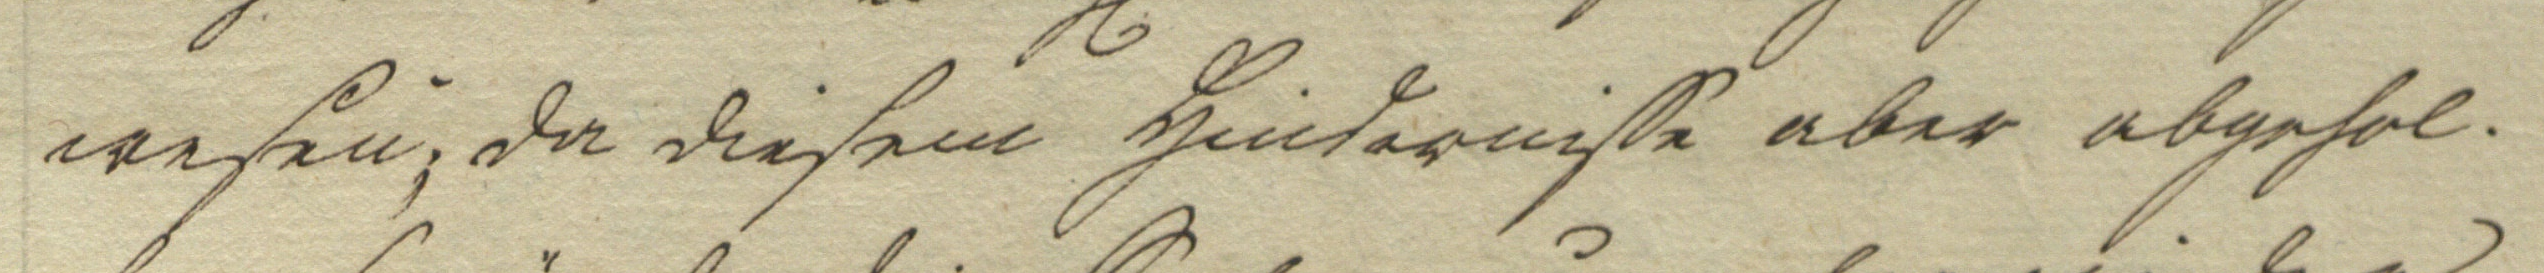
wesen; da diesem Hindernisse aber abgehol¬
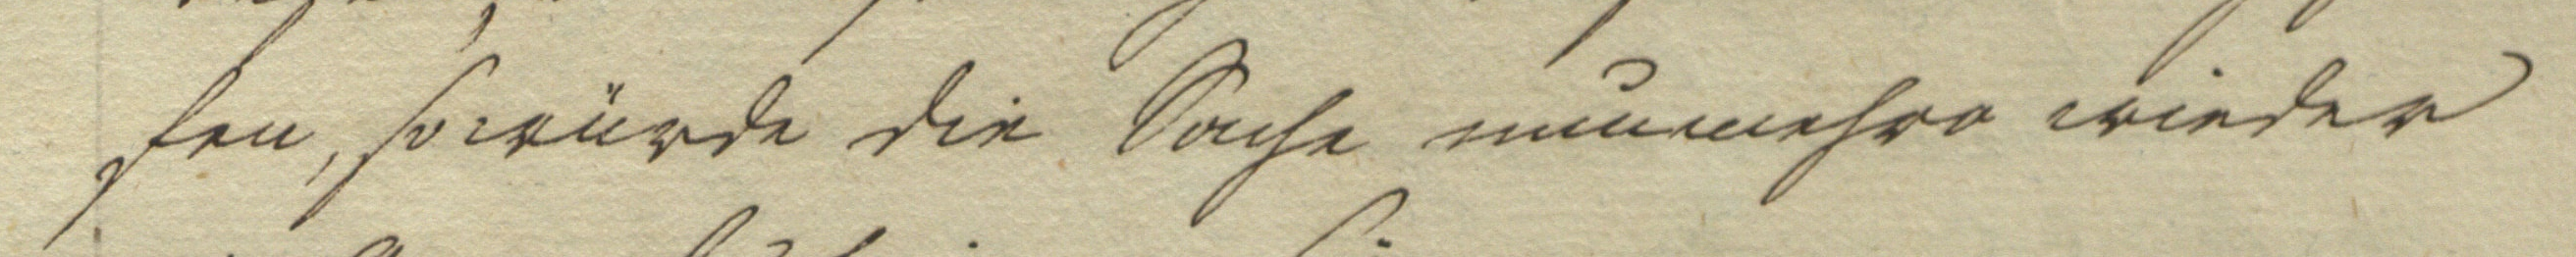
fen, so würde die Sache nunmehro wieder
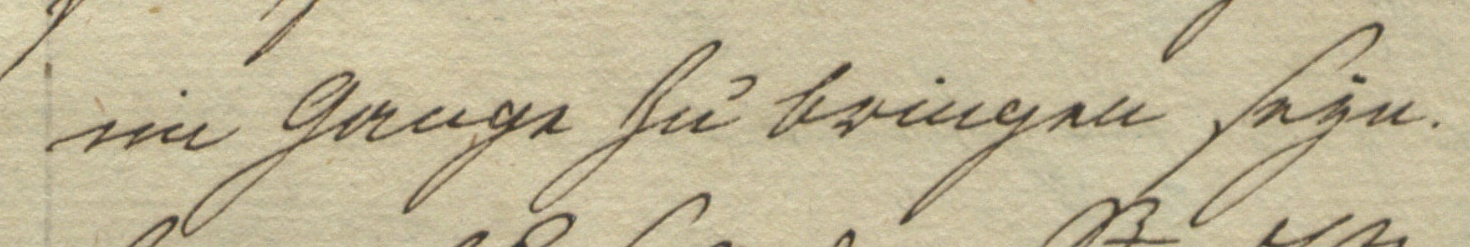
im Gange zu bringen seÿn.
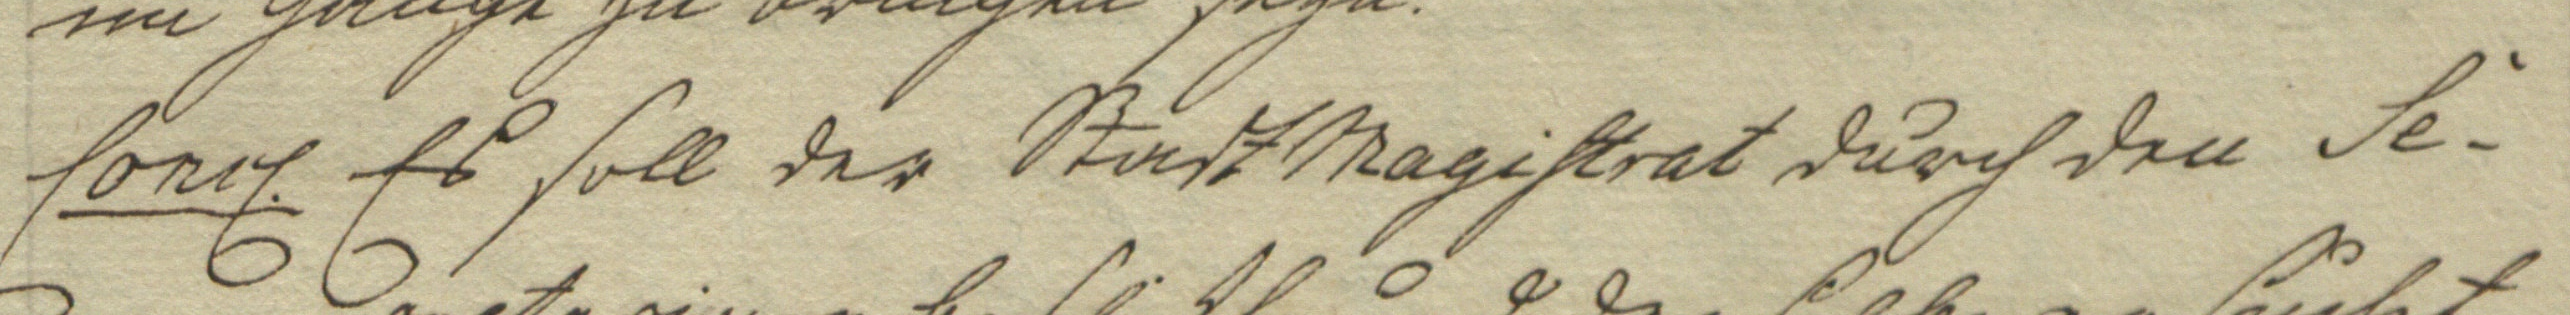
Concl. Es soll der Stadt Magistrat durch den Se¬
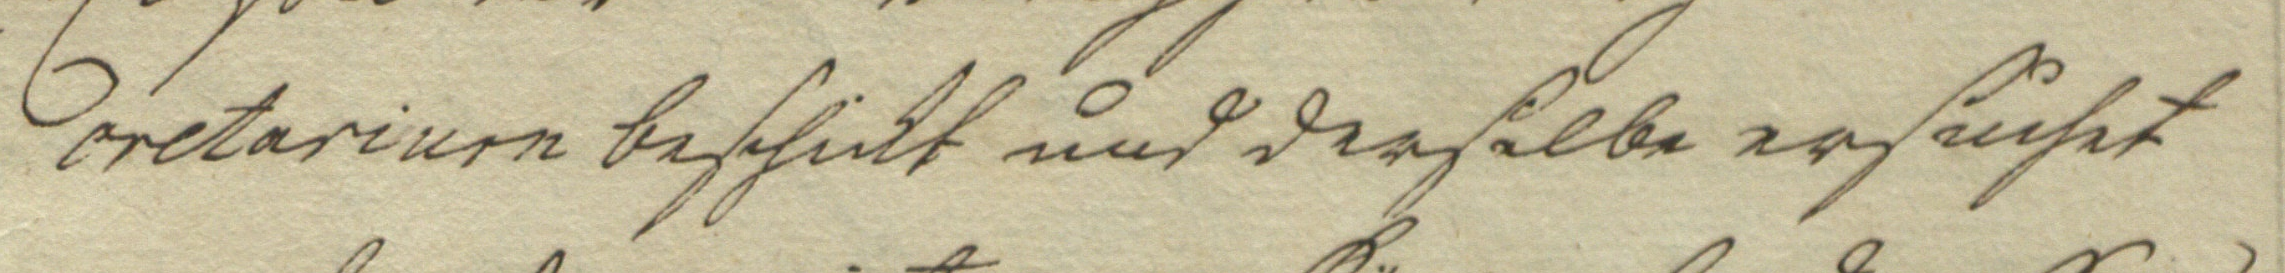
cretarium beschickt und derselbe ersuchet
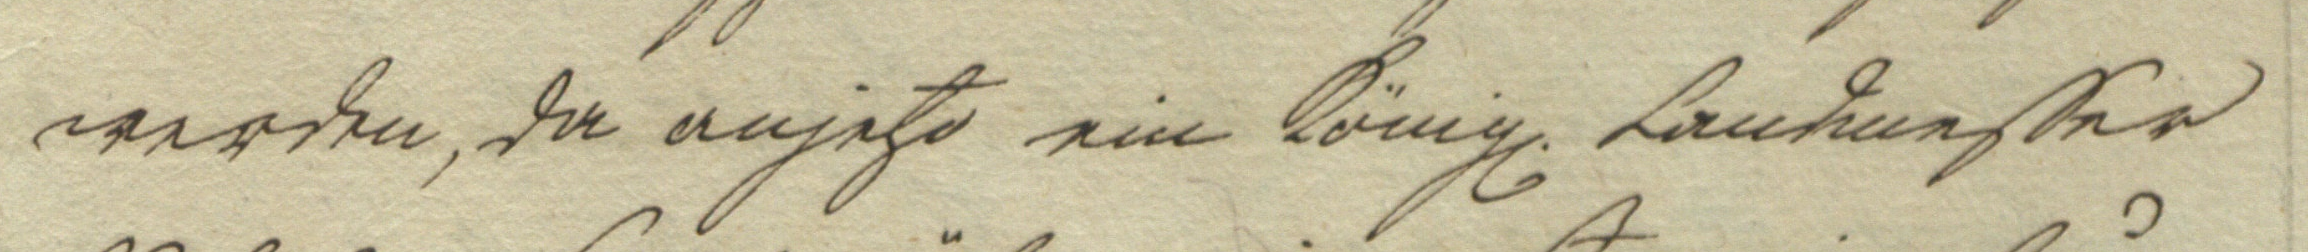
werden, da anjetzo ein Königl. Landmesser
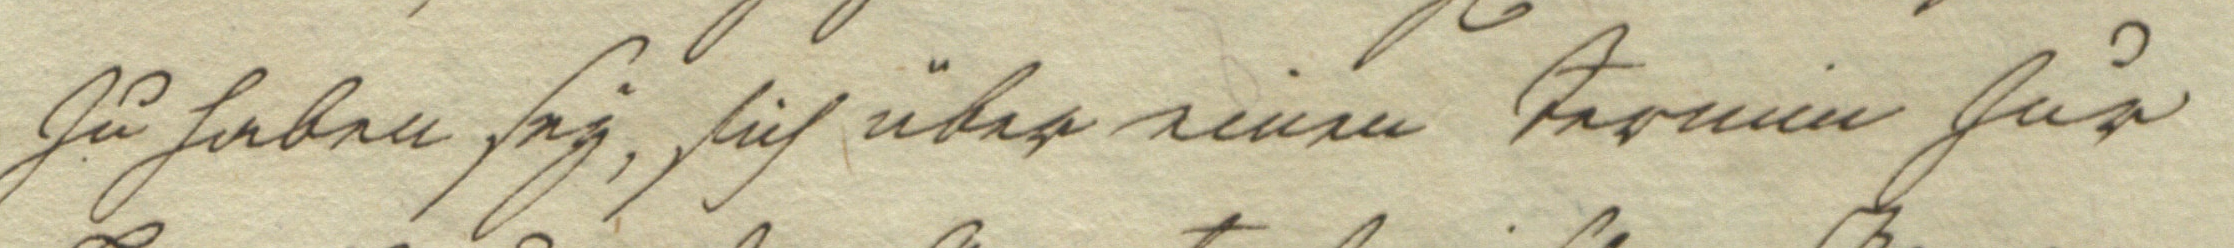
zu haben seÿ, sich über einen Termin zur
